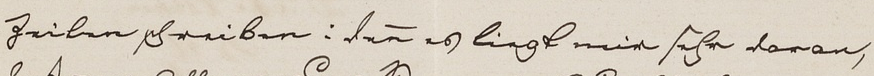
Zeilen schreiben: denn es liegt mir sehr daran,
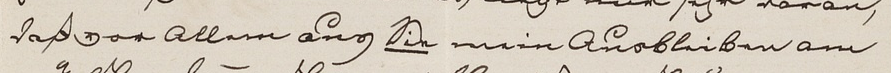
daß vor Allem aus Sie mein Ausbleiben am
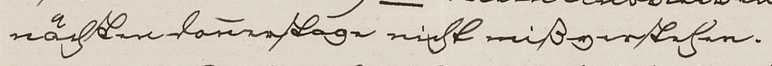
nächsten Donnerstage nicht mißverstehen.
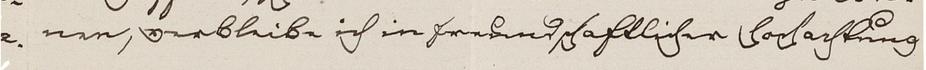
nen, verbleibe ich in freundschaftlicher Hochachtung
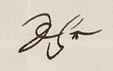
Escher
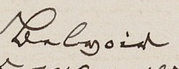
Belvoir
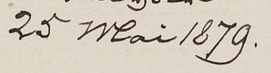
25 Mai 1879
